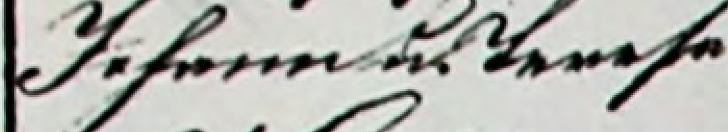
Johann u. Leresa
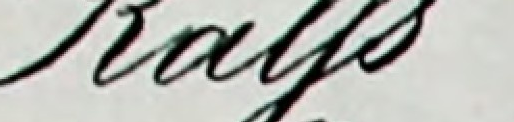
Kalss
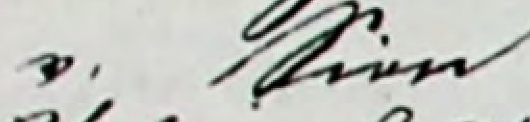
v. Sion
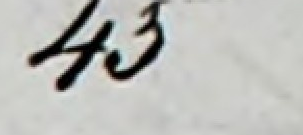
43
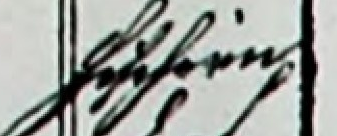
Fischern„
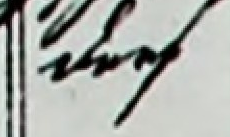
dorf
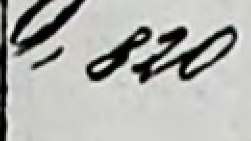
0,820
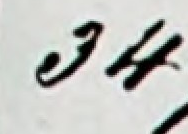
34
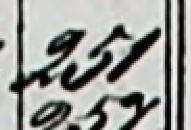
251
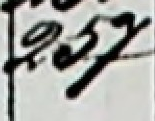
257
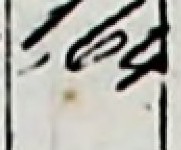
1,64
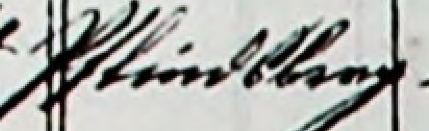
Pflindsberg
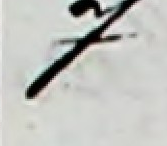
7
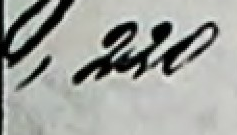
0,220
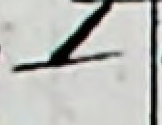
I
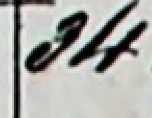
34
